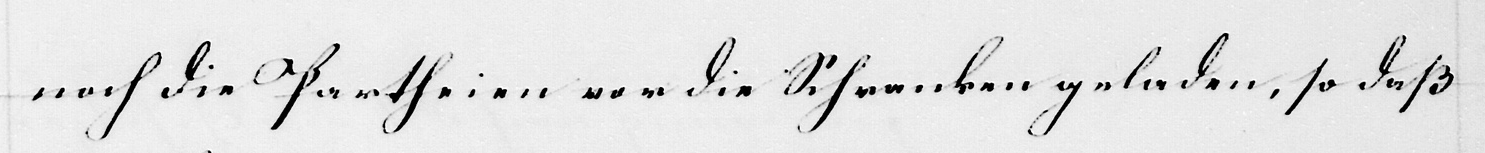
noch die Partheien vor die Schranken geladen, so daß
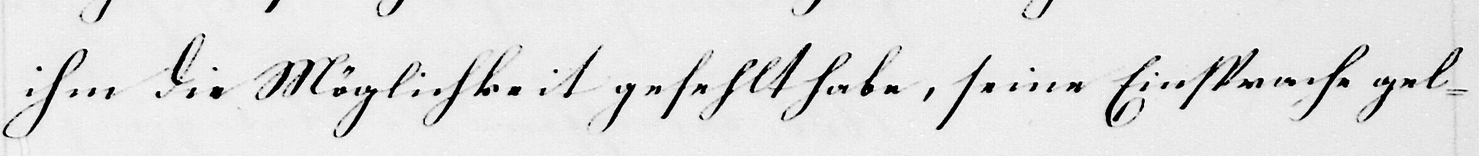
ihm die Möglichkeit gefehlt habe, seine Einsprache gel¬
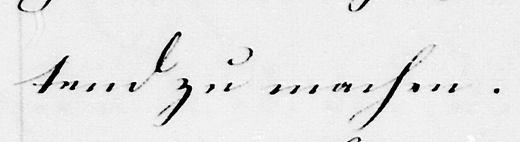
tend zu machen.
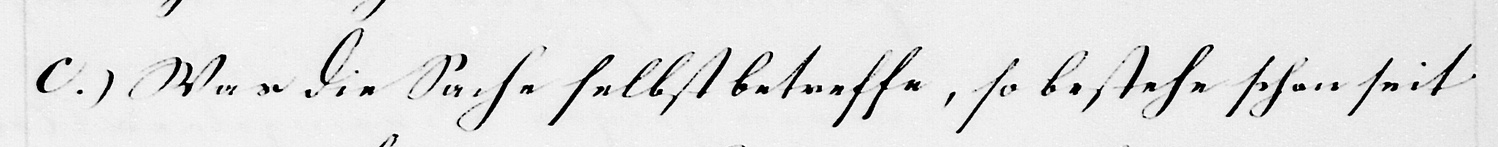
c.) Was die Sache selbst betreffe, so bestehe schon seit
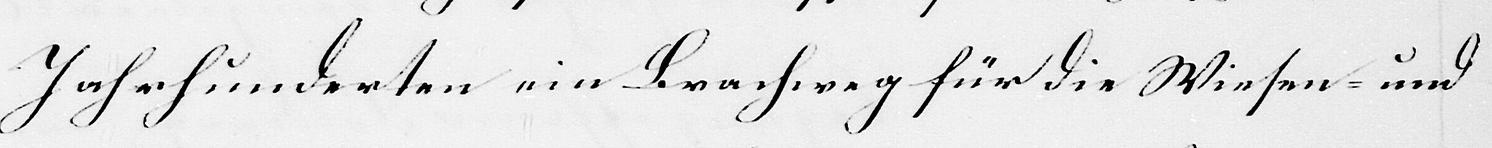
Jahrhunderten ein Brachweg für die Wiesen- und
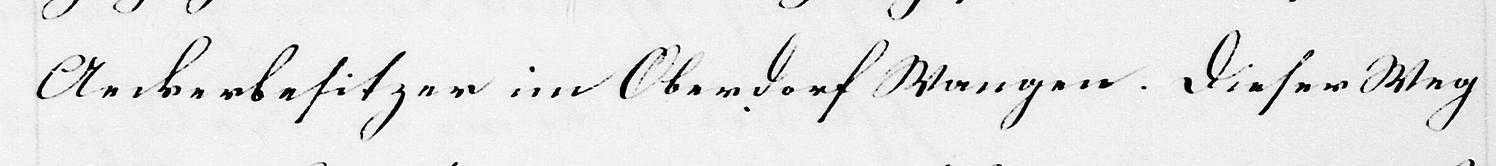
Aeckerbesitzer im Oberdorf Wangen. Dieser Weg
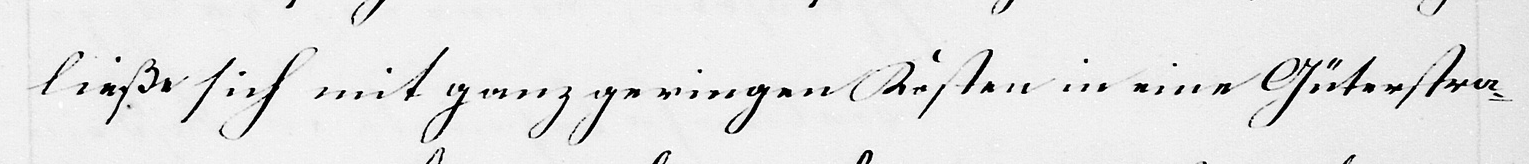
ließe sich mit ganz geringen Kosten in eine Güterstra¬
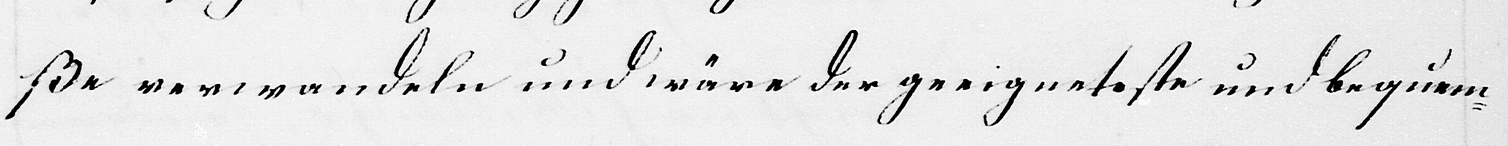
ße verwandeln und wäre der geeigneteste und bequem¬
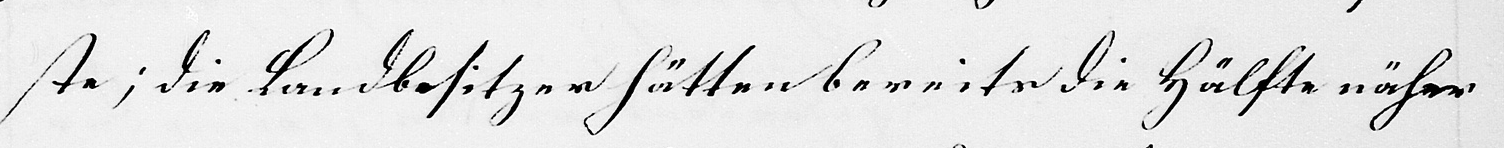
ste; die Landbesitzer hätten bereits die Hälfte näher
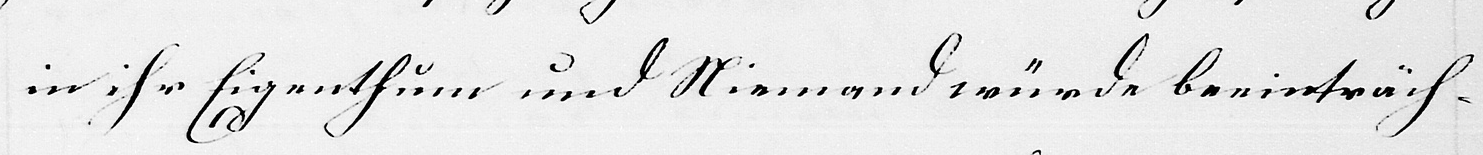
in ihr Eigenthum und Niemand würde beeinträch¬
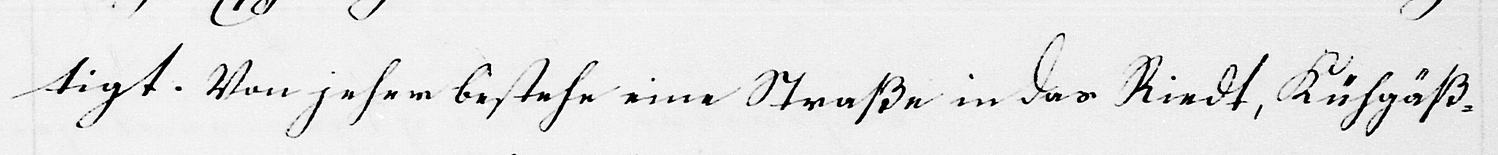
tigt. Von jeher bestehe eine Straße in das Riedt, Kühgäß¬
